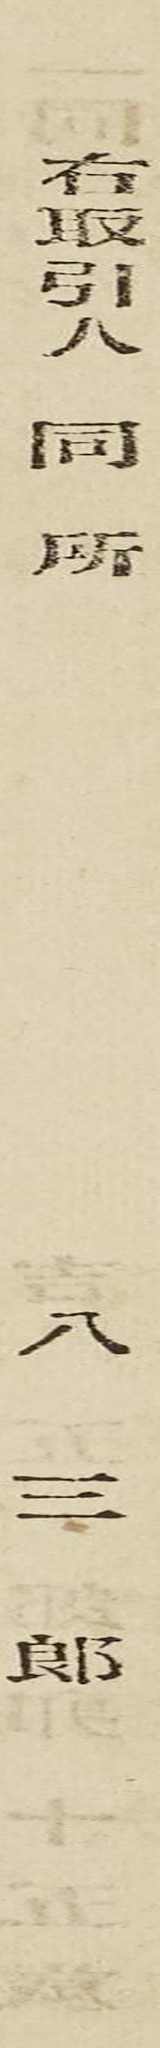右引取人同所八三郎
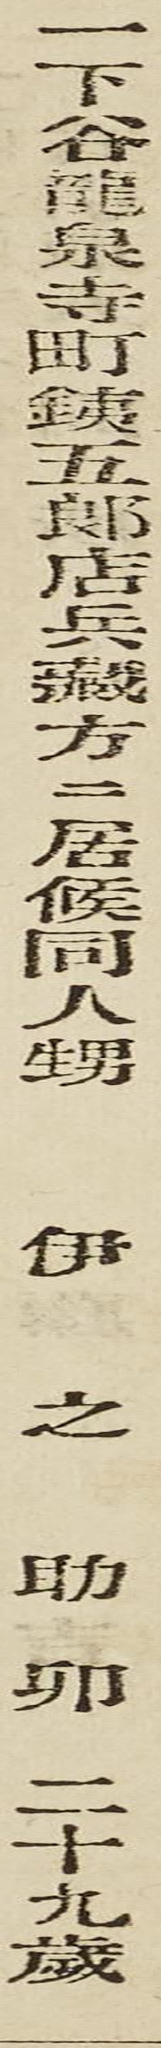一下谷龍泉寺町銕五郎店兵蔵方ニ居候同人甥伊之助卯二十九歳
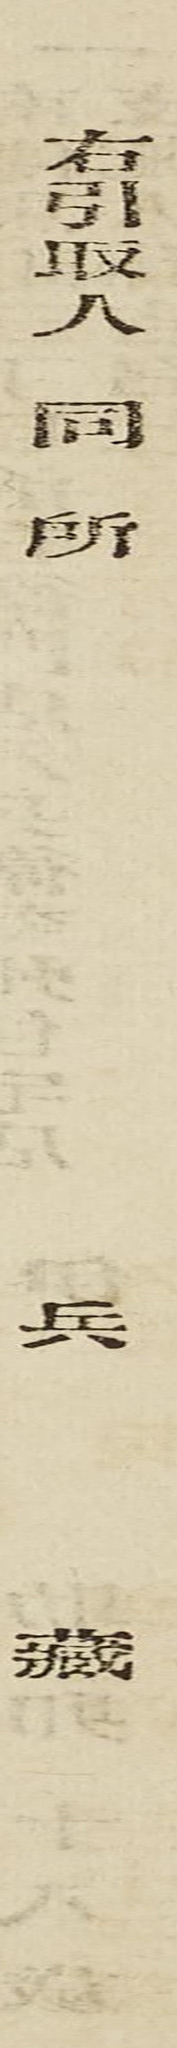右引取人同所兵蔵
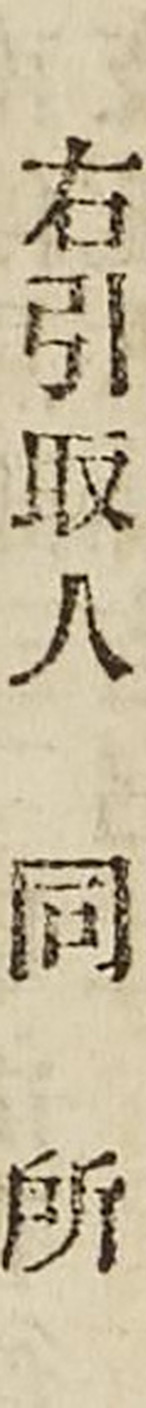右引取人同同
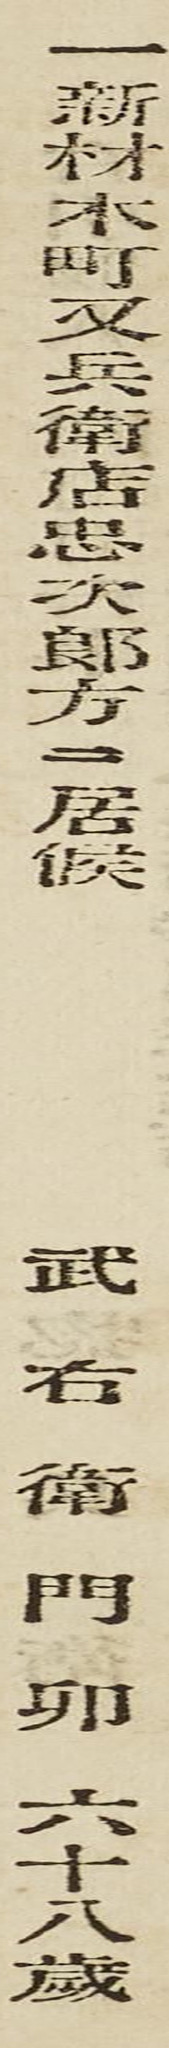一新材木町又兵衛店忠次郎方ニ居候武右衛門卯六十八歳
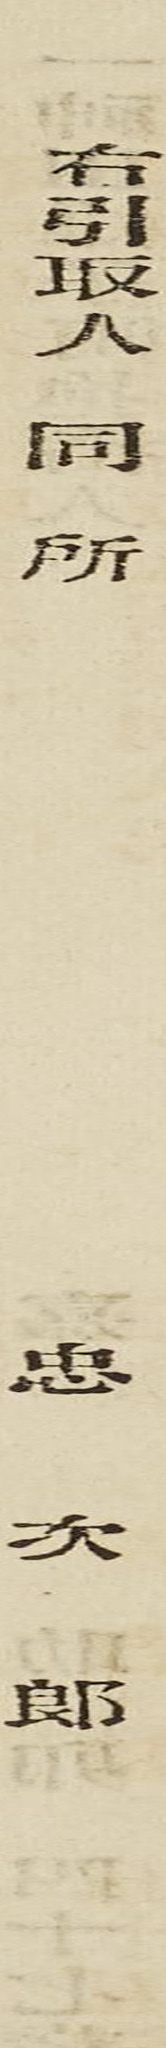右引取人同所八三郎
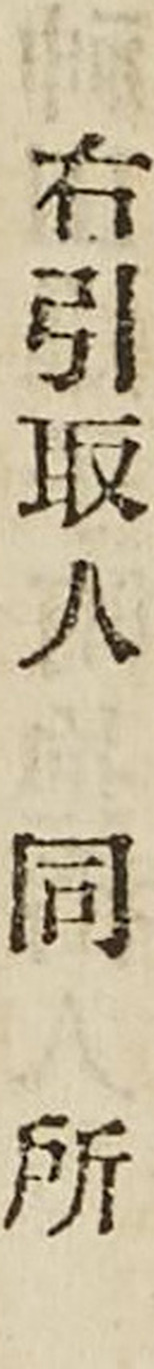右引取人同同
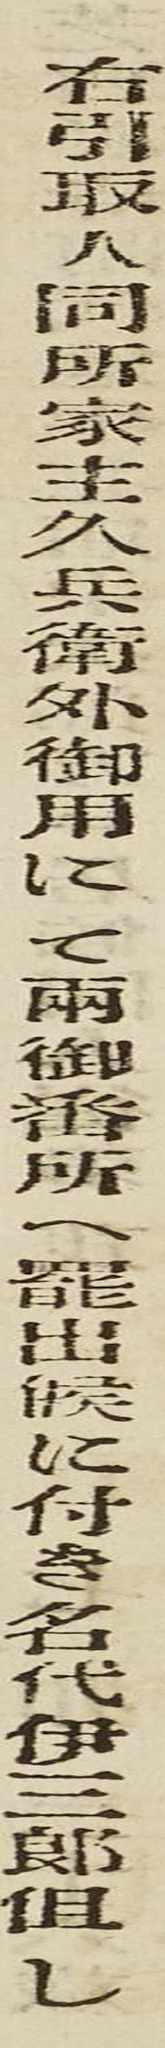右引取人同所家主久兵衛外御用にて両御番所へ罷出候に付き名代伊三郎伹し
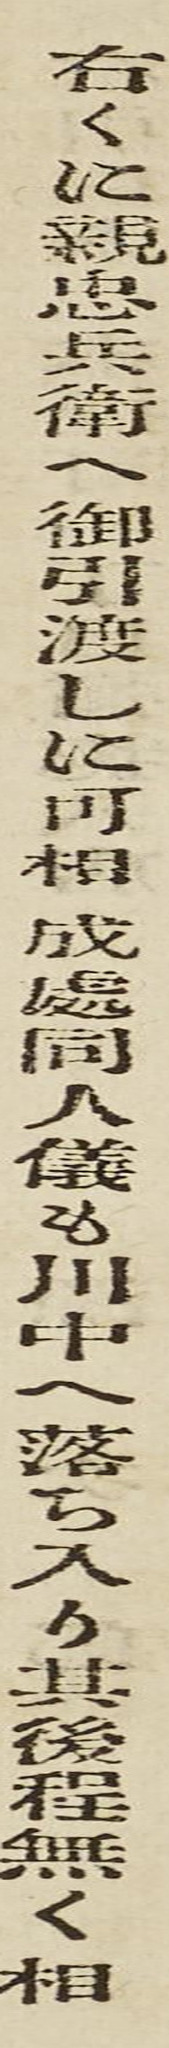右くに親忠兵衛へ御引渡しに可相成処同人儀も川中へ落ち入り其後程無く相
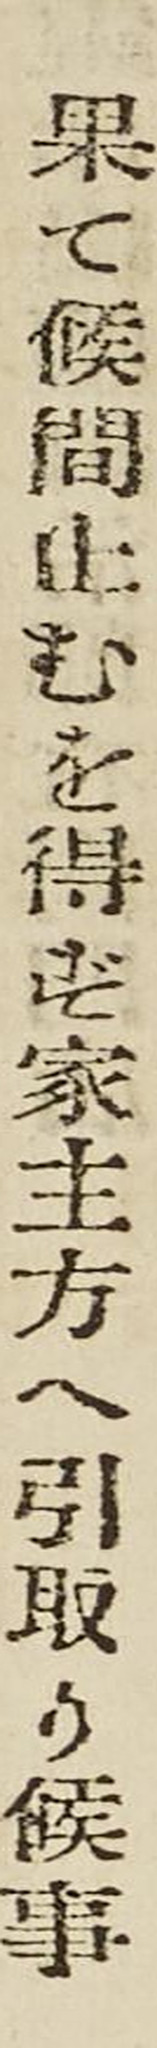果て候間止むを得ず家主方へ引取り候事
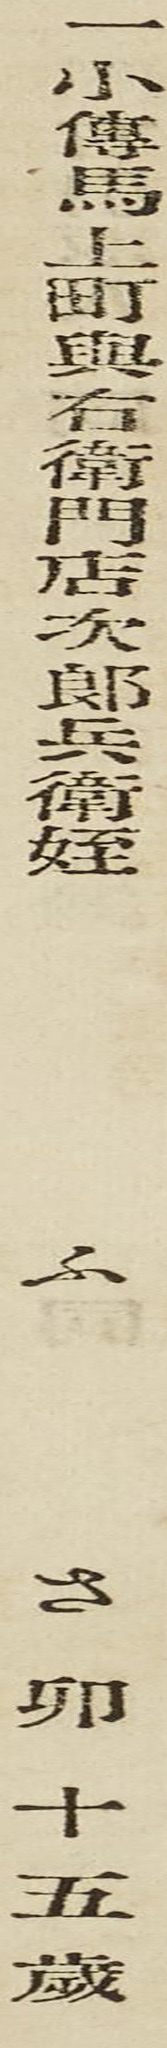一小伝馬上町與右衛門店次郎兵衛姪ふさ卯十五歳
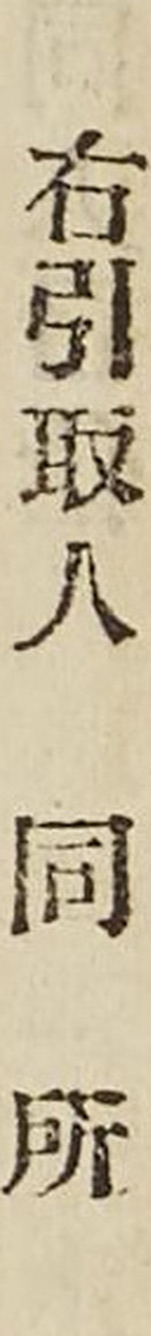右引取人同同
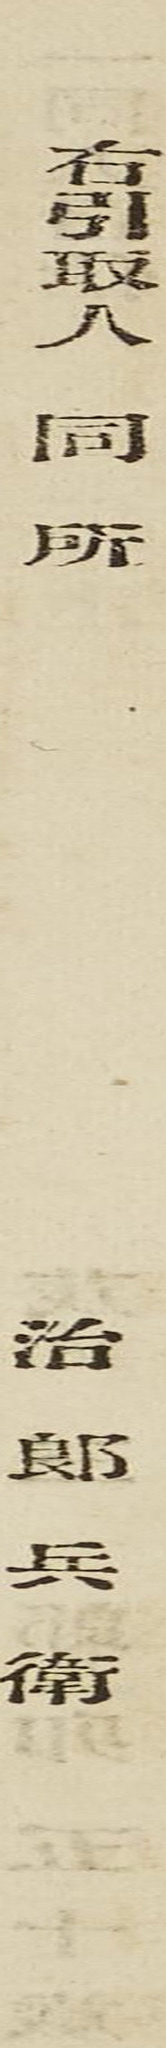右引取人同所治郎兵衛
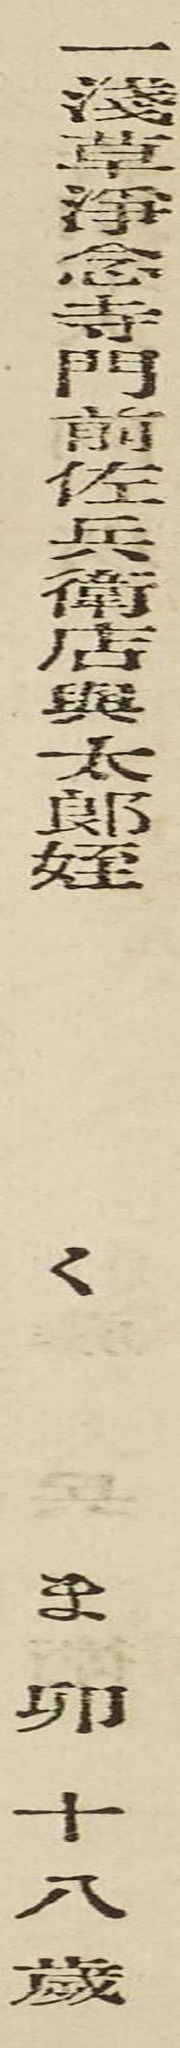一浅草浄念寺門前佐兵衛店與太郎姪くま卯十八歳
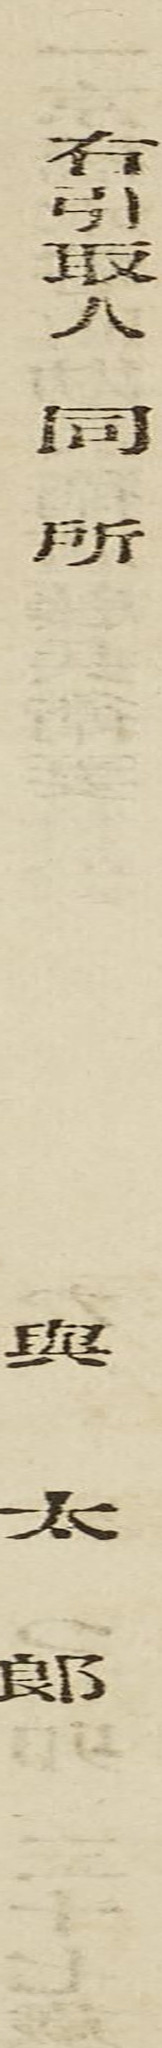右引受人同所與太郎
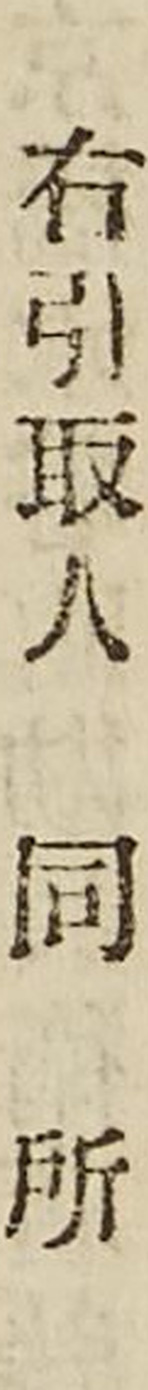右引取人同同
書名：永代惨話　文化の夢　全
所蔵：東京大学地震研究所図書室 Earthquake Research Institute Library, The University of Tokyo, JAPAN
